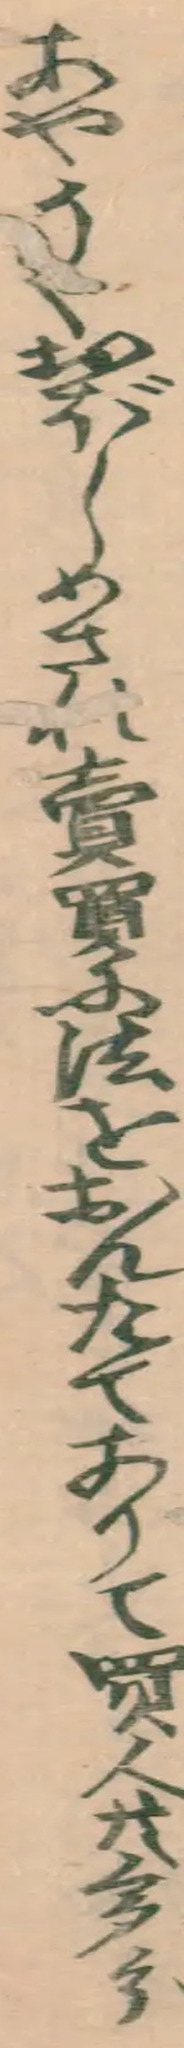あやうくおぼしめされ売買に法をおんたてありて買人共多分
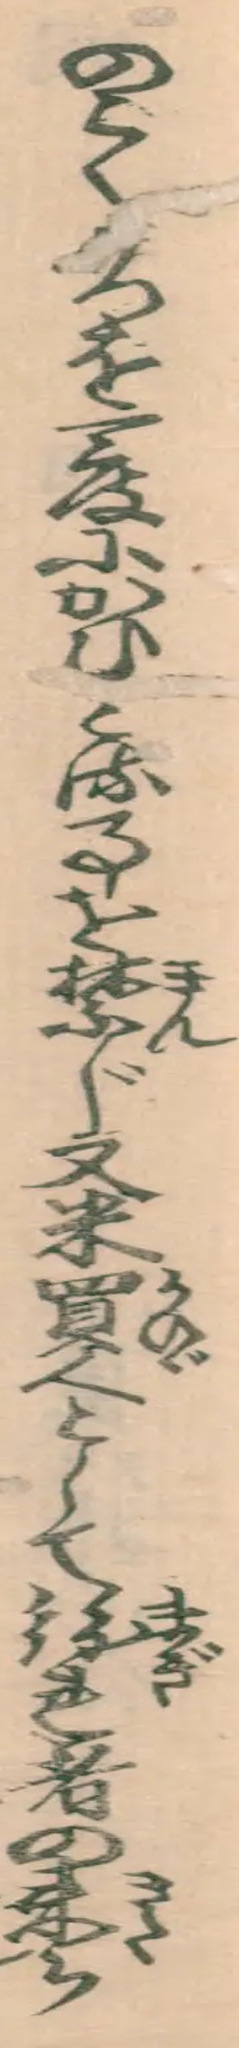のこくもつを一度にかひとる事を禁じ又米買人として紛れ者の来ら
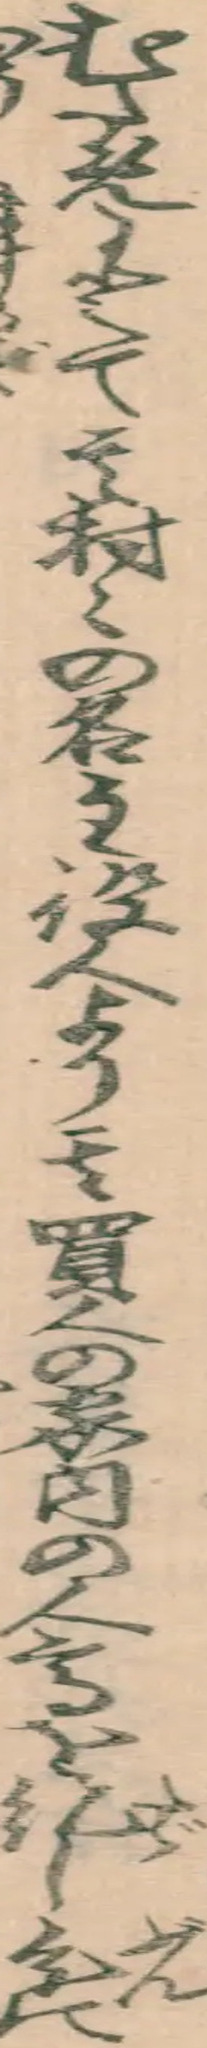むためにとて其村々の名主役人より其買人の家内の人高を糺し分に
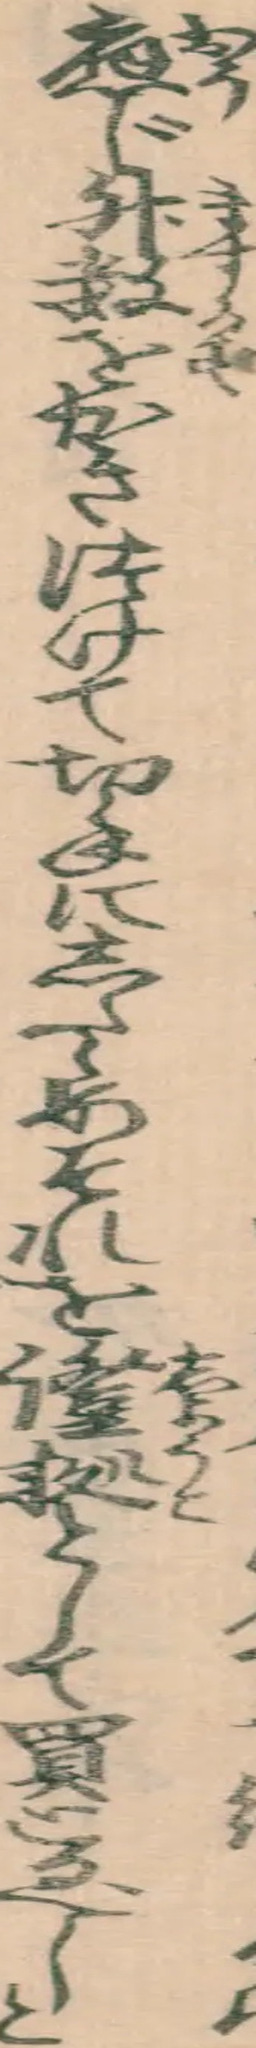応じ升数をかきつけて切手にしたゝめそれを証拠として買とるべしと
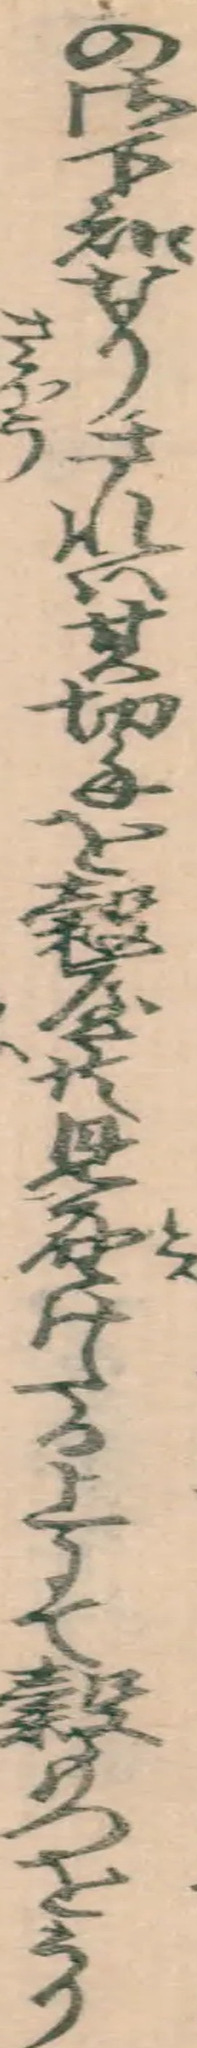の御下知なりされは其切手を穀屋共見届けたる上にて穀もつをうり
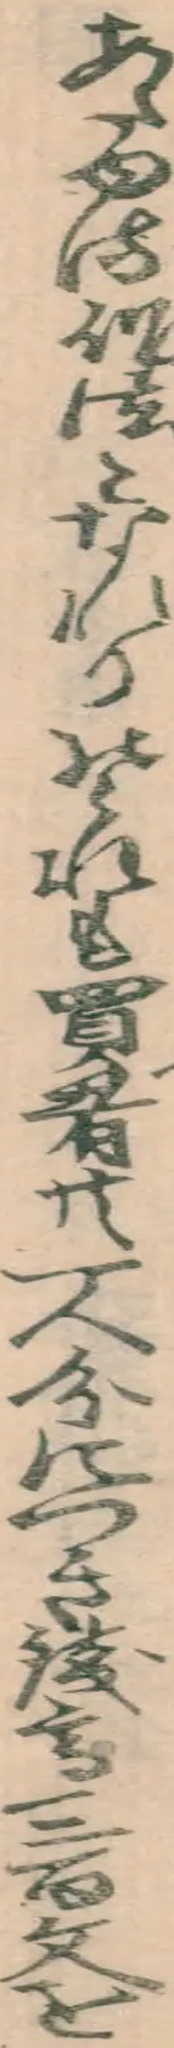あたゆる作法となれりそれも買者共一人分につき銭高三百文を
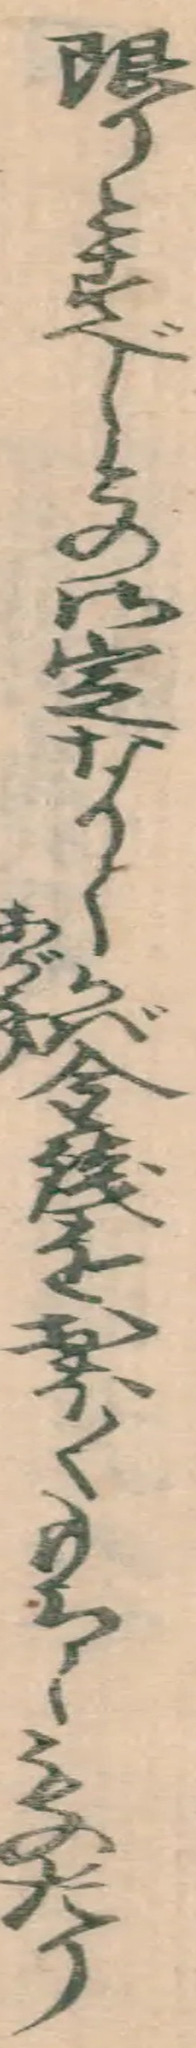限りとすべしとの御定なりしかば金銭をおほくもちしものたり
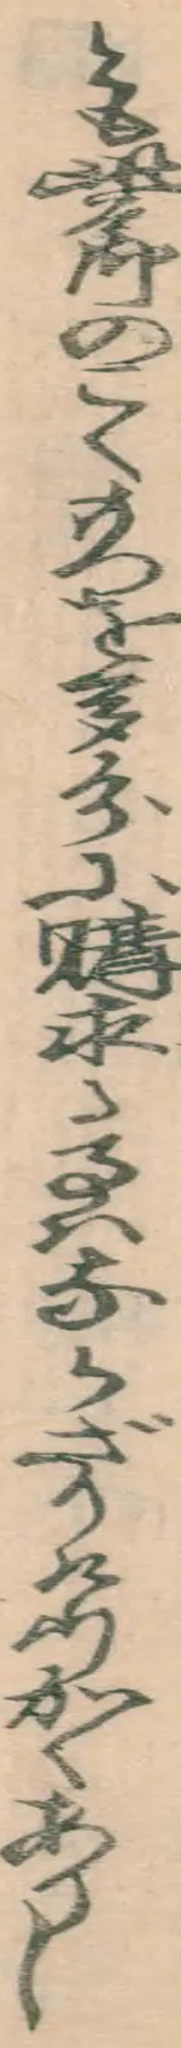とも此節のこくもつを多分に購求る事はなかざりけりかくありし
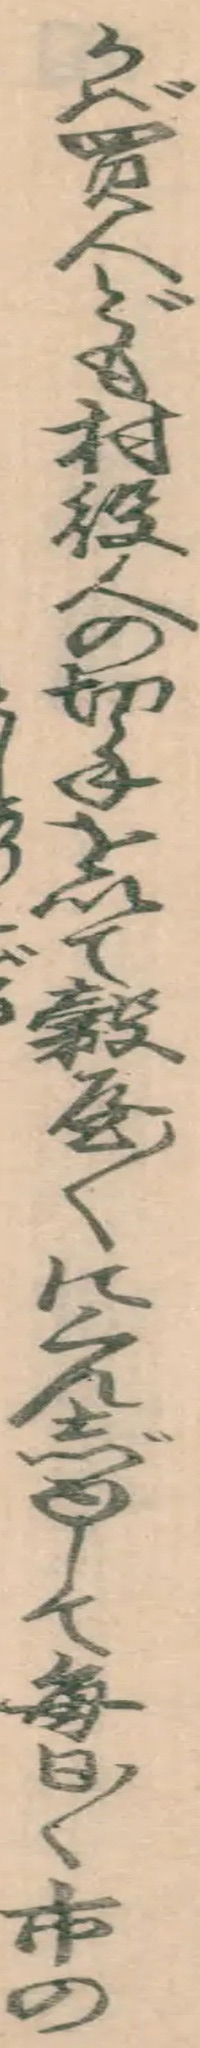かば買人ども村役人の切手を以て穀屋〳〵にくんじゆして毎日〳〵市の
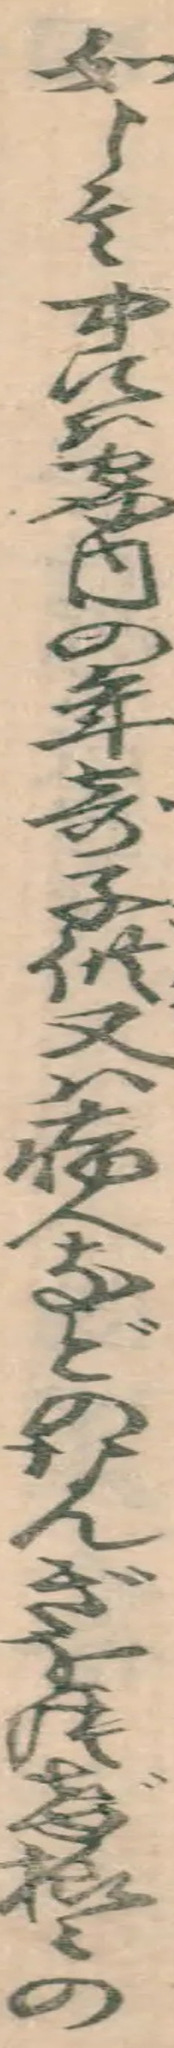如し其中には家内の年寄子供又は病人などのなんぎをつげ様々の
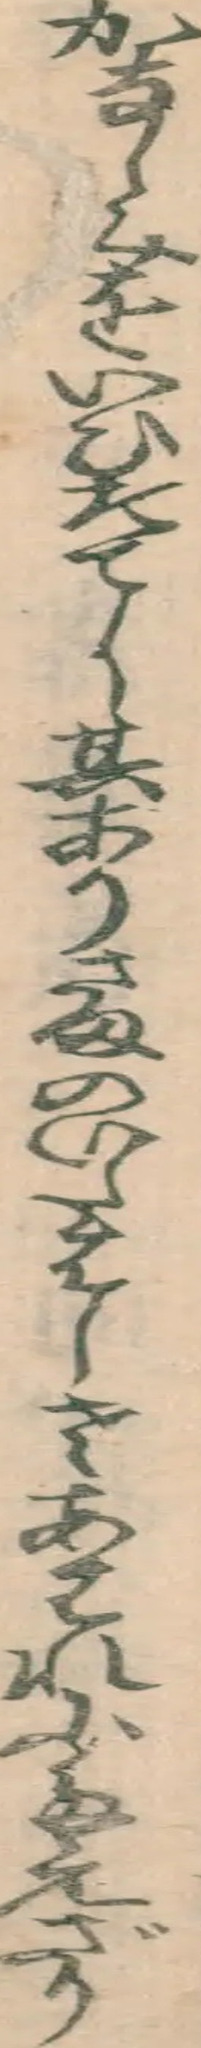かなしみをいひたてし其ありさまのいたはしさあはれにたえざり
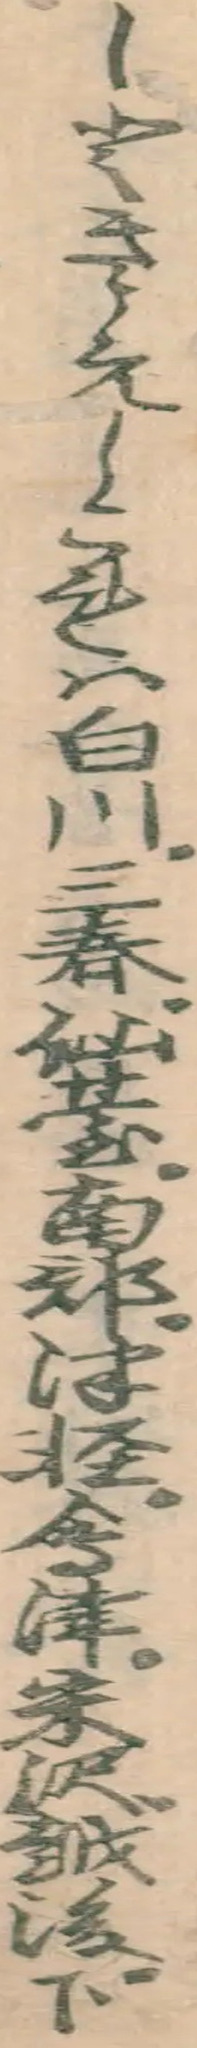しときこえしこれは白川．三春．仙台．南部．津軽．会津．米沢．越後．下
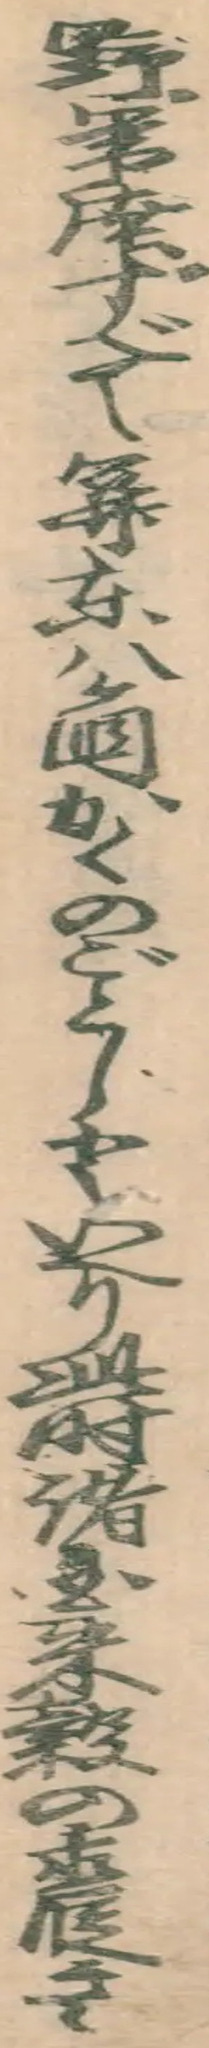野．常陸．すべて関東八ヶ国かくのごとしといへり此時諸国米穀の直段きゝ

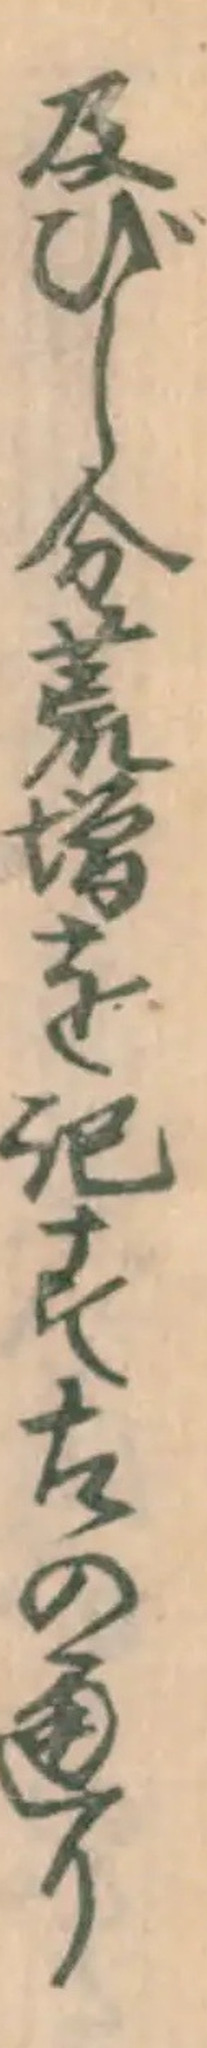及びし分荒増を記す左の通り
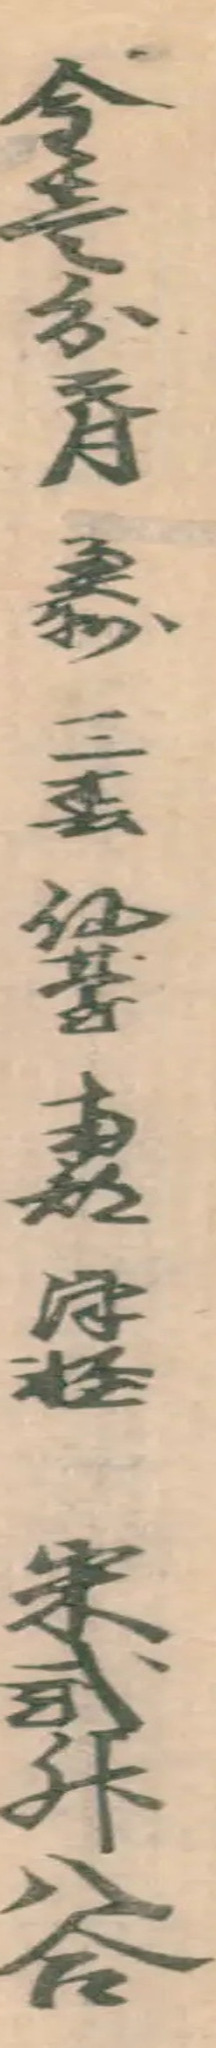金壱分に付奥州三春仙台南部津軽米弐升八合
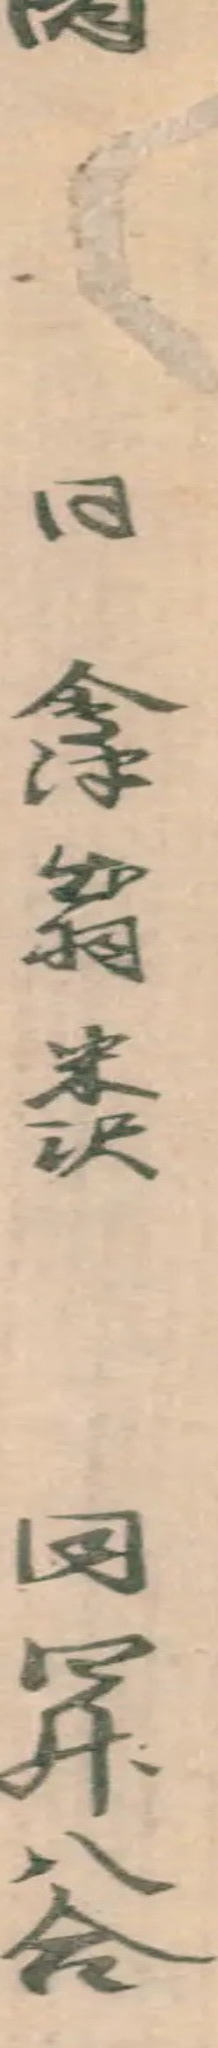同同会津出羽米沢同四升八合
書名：日ごとの心得
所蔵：国立国会図書館 National Diet Library, JAPAN
